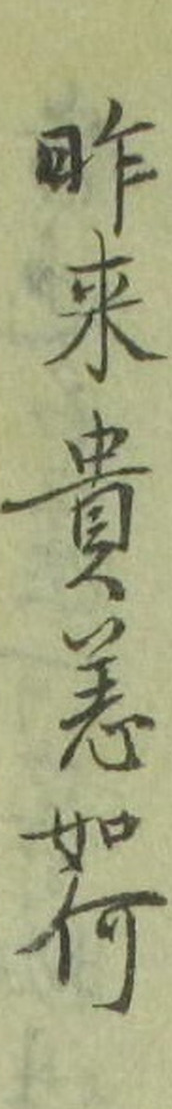昨来貴恙如何鳴
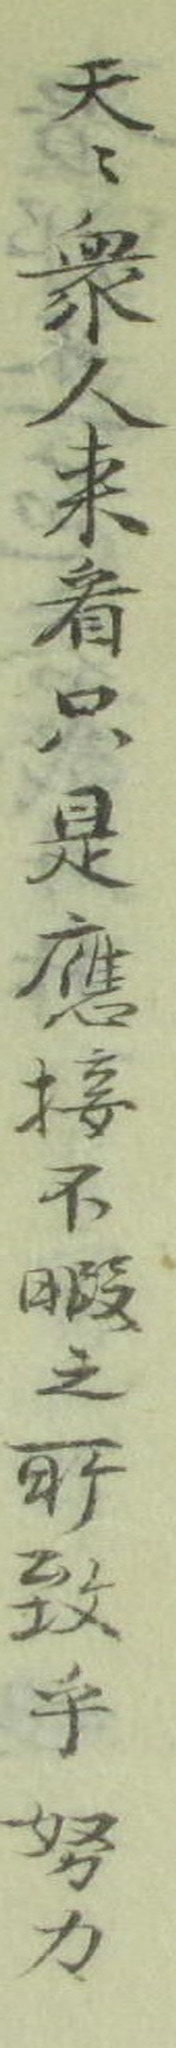天ニ衆人来看只是応接不暇之所致乎努力
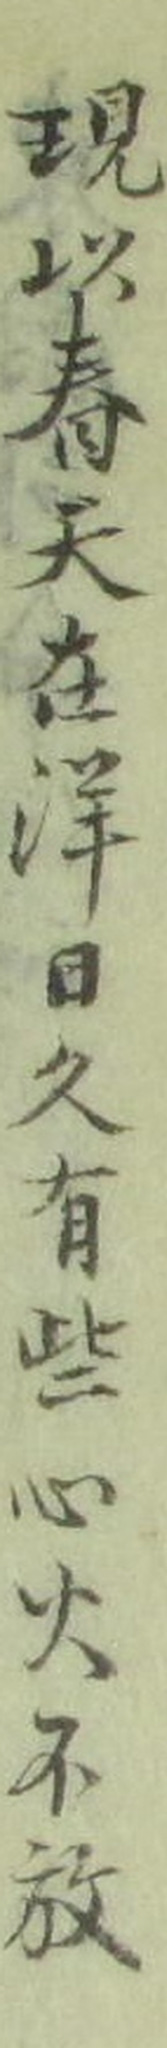現以春天在洋日久有些心火不放王
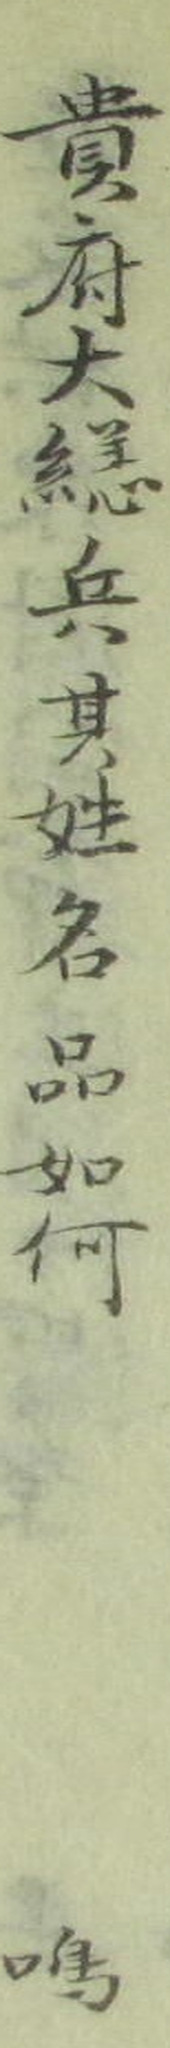貴府大兵其姓名品如何鳴
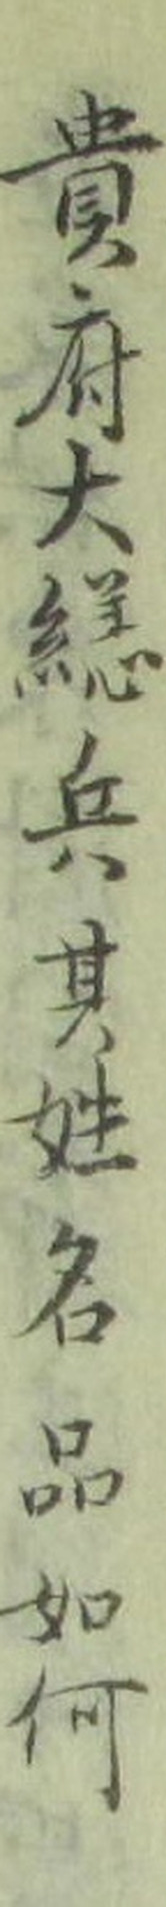貴府大兵其姓名品如何鳴
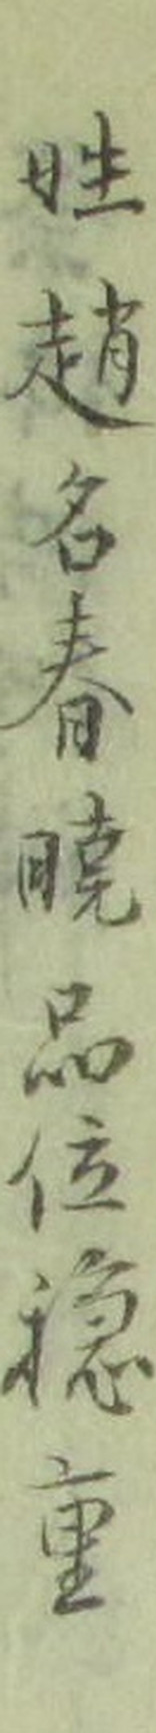姓趙名春暁品位穏重王
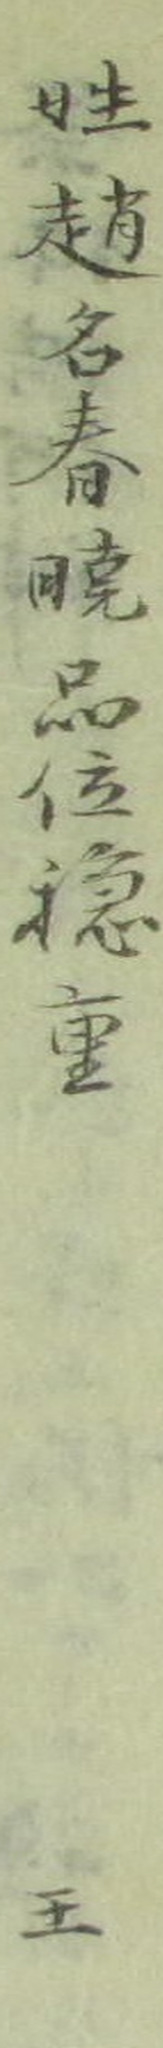姓趙名春暁品位穏重王
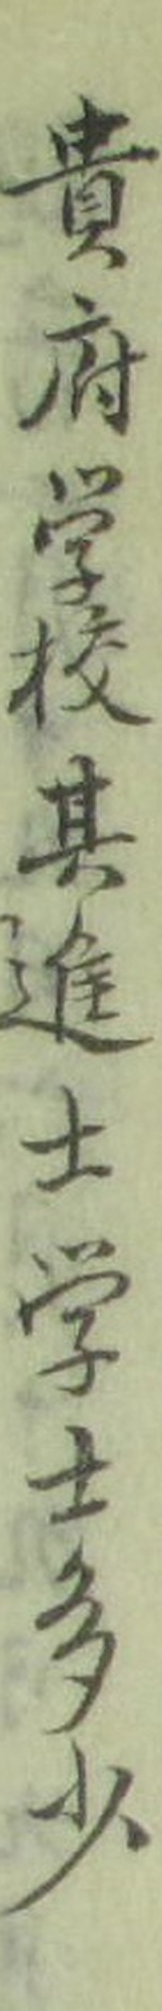貴府学校其進士学士多少鳴
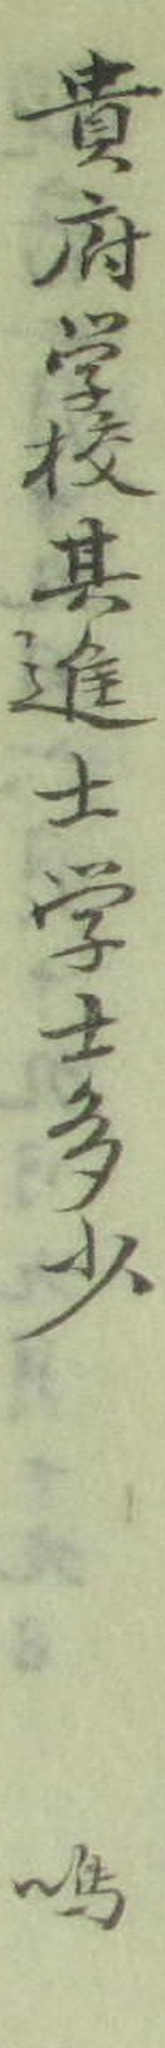貴府学校其進士学士多少鳴
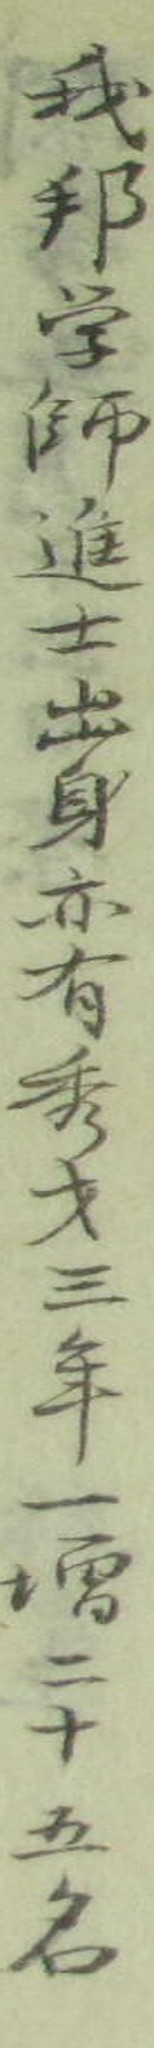我邦学師進士出身亦有秀才三年一増二十五名
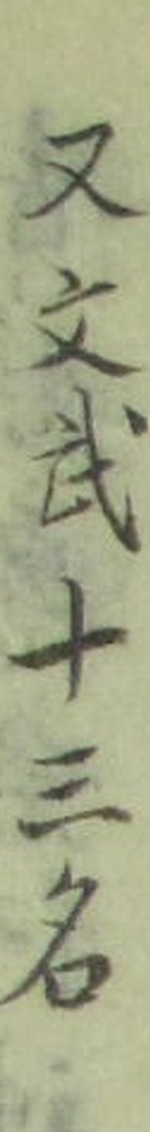又文武十三名王
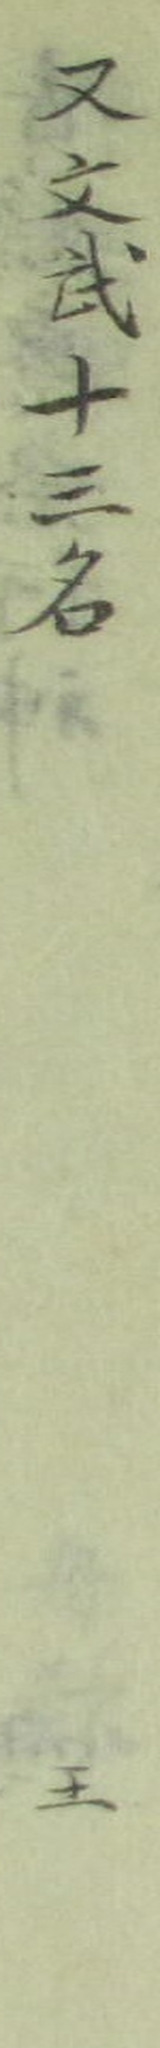又文武十三名王
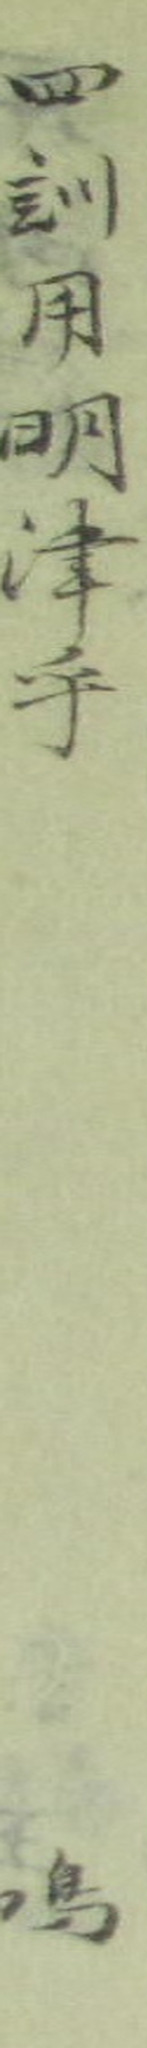四訓用明津乎鳴

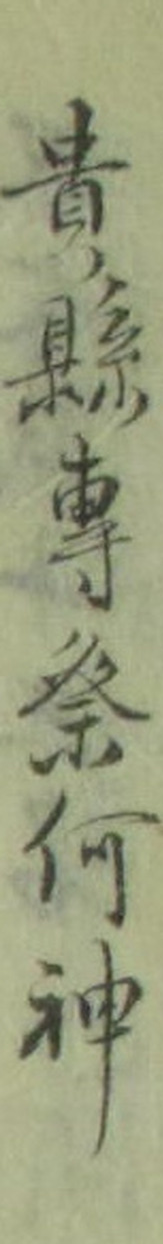貴県専祭何神鳴
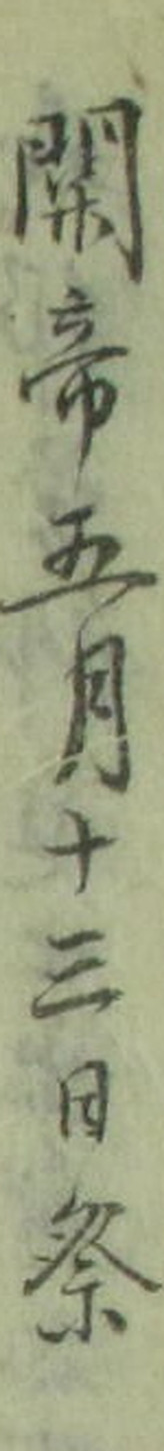関帝五月十三日祭王
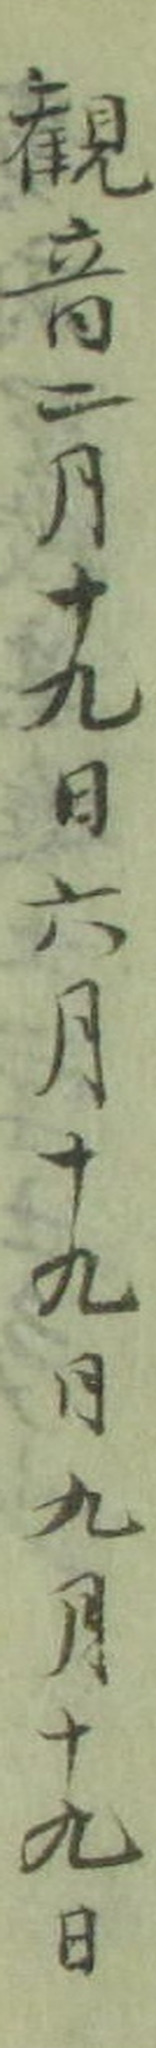観音二月十九日六月十九日九月十九日
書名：紀州九木浦庄屋記録 四
